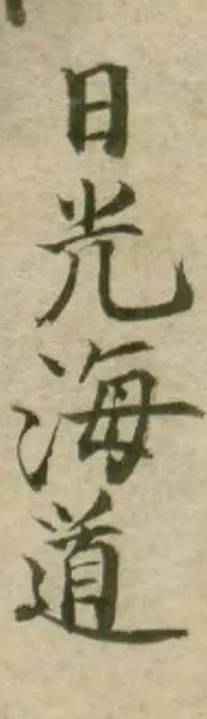日光海道
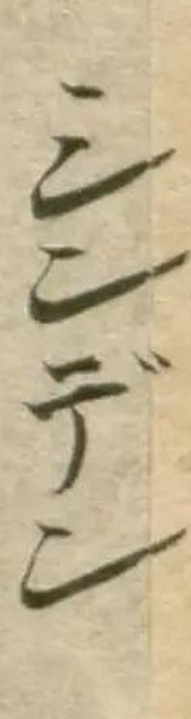シンデン
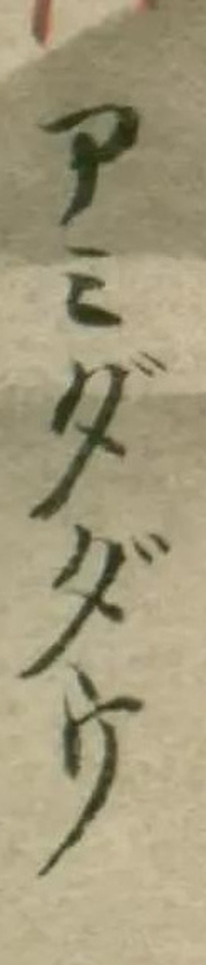アミダダウ
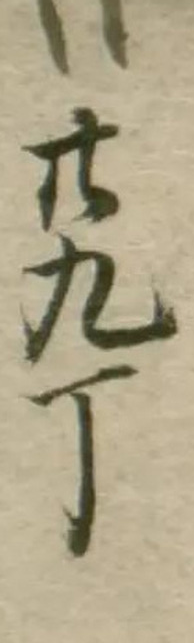廿九丁

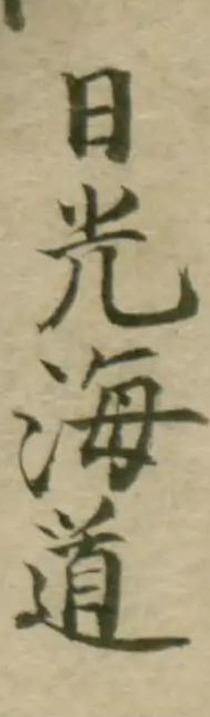日光海道
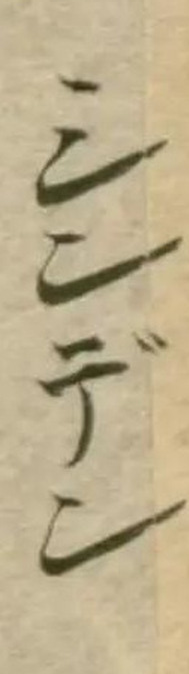シンデン
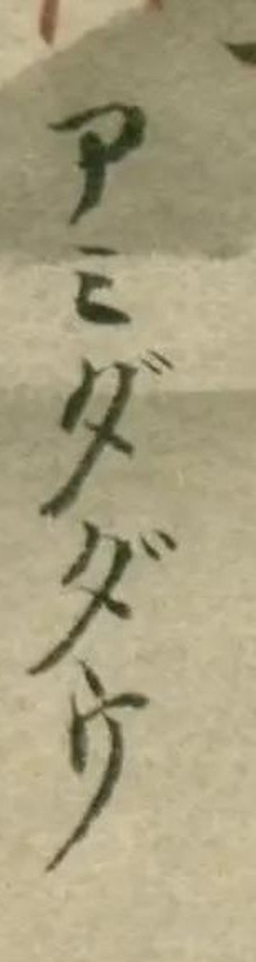アミダダウ
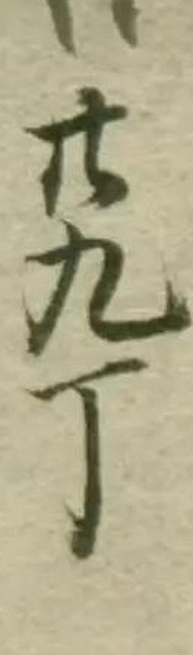廿九丁
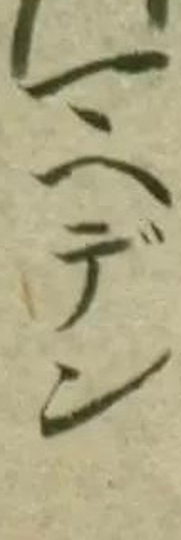マヘデン
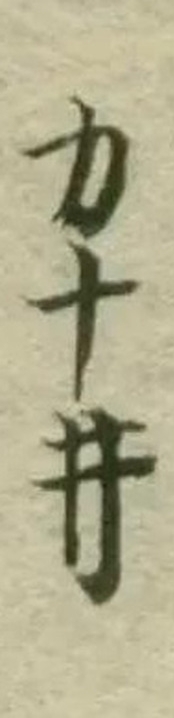カナ井
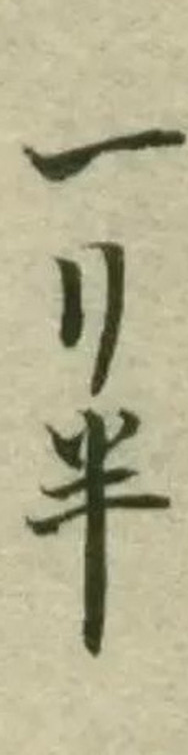一リ半
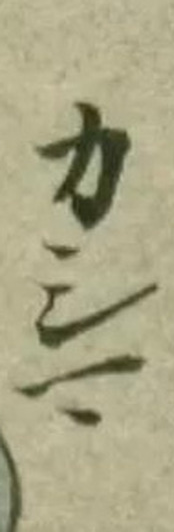カシマ
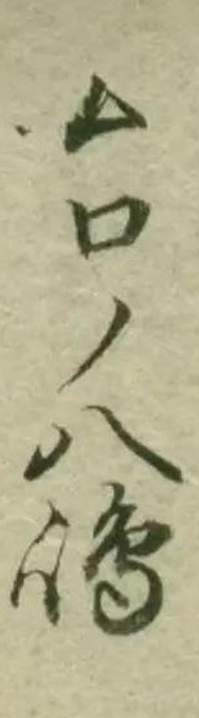ムロノ八嶋
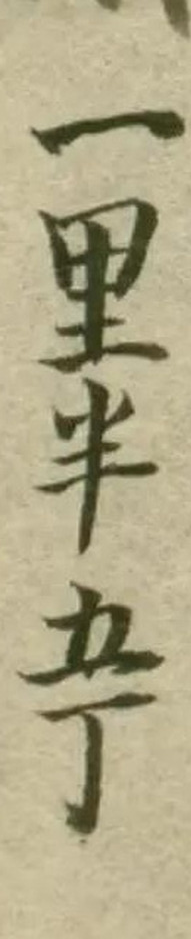一里半五丁
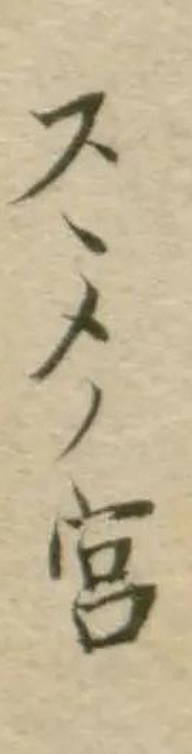スヽメノ宮

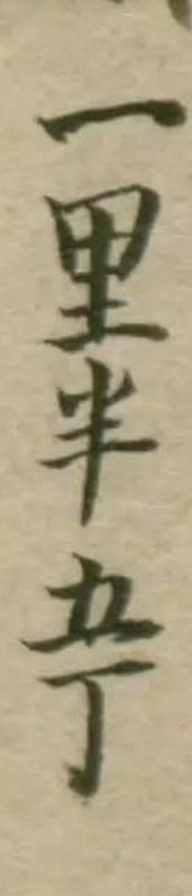一里半五丁
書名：江戸より奥州津輕迄道筋之圖
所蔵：国立国会図書館 National Diet Library, JAPAN
